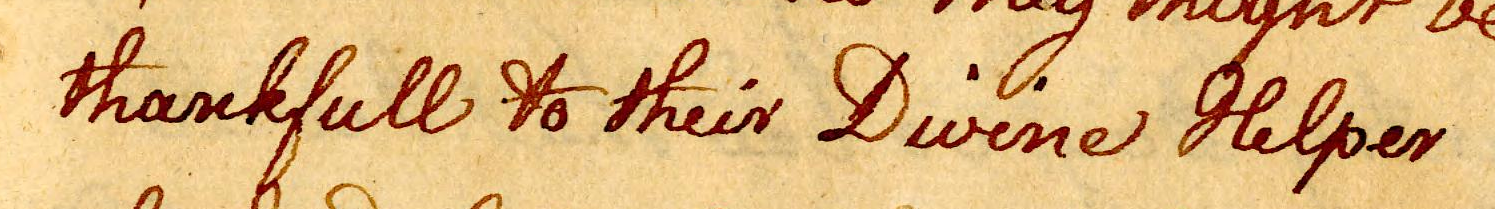thankfull to their Divine Helper
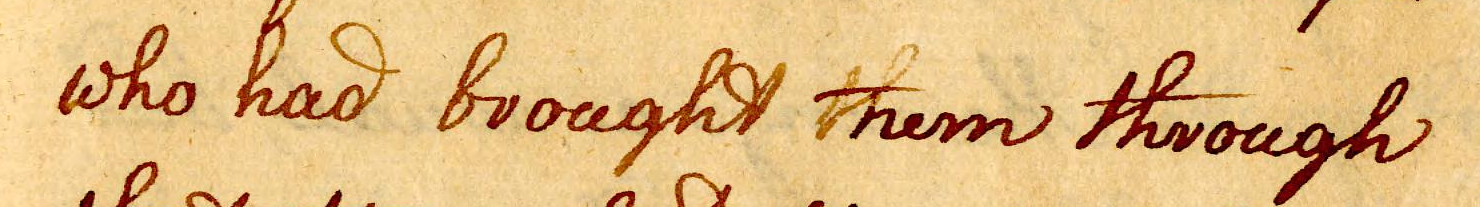who had brought them through
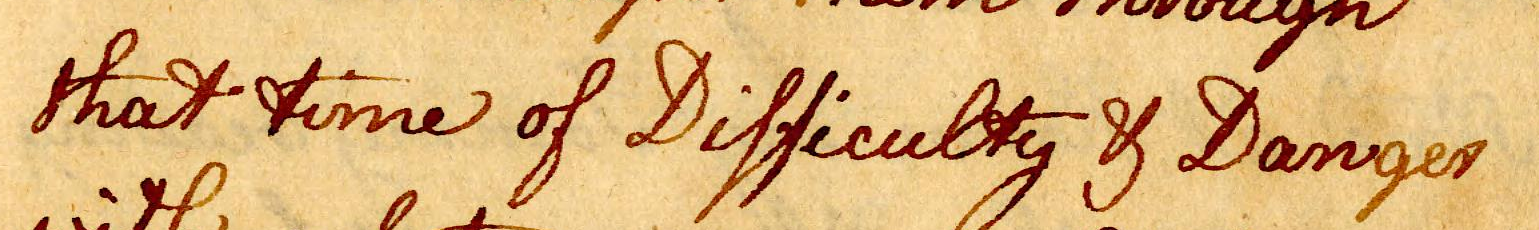that time of Difficulty & Danger
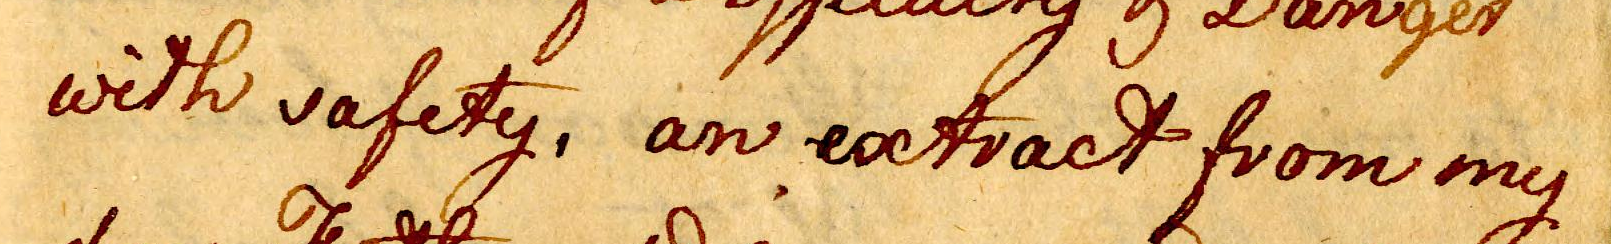with safety, an extract from my
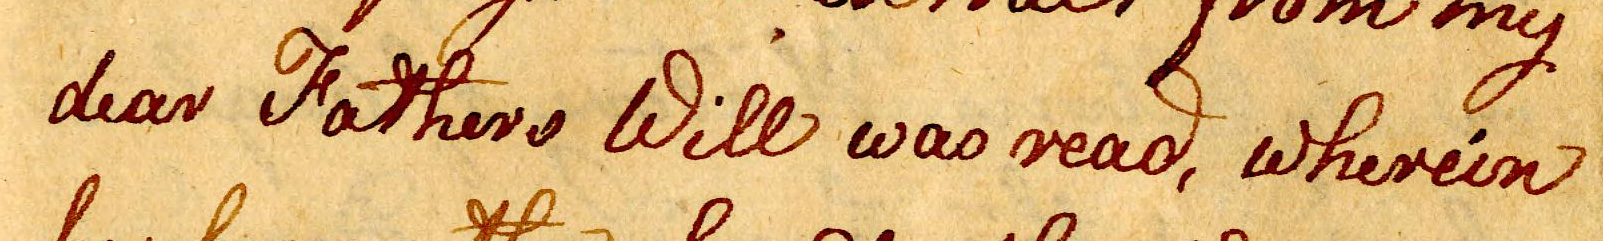dear Fathers Will was read, wherein
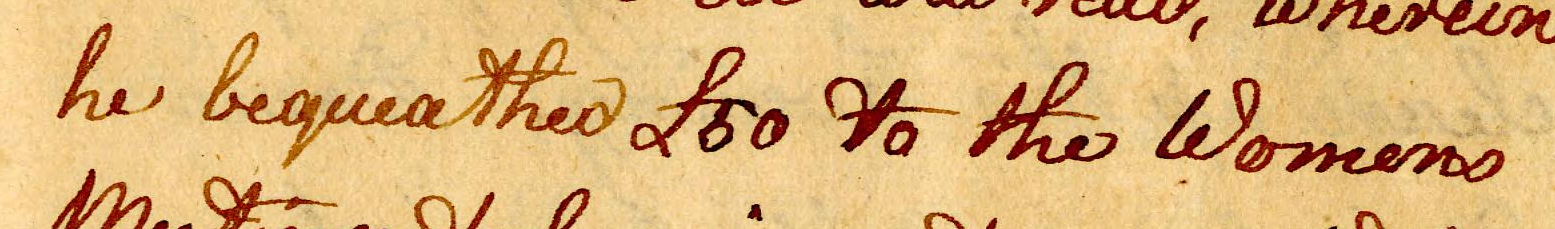he bequeathed £50 to the Womens
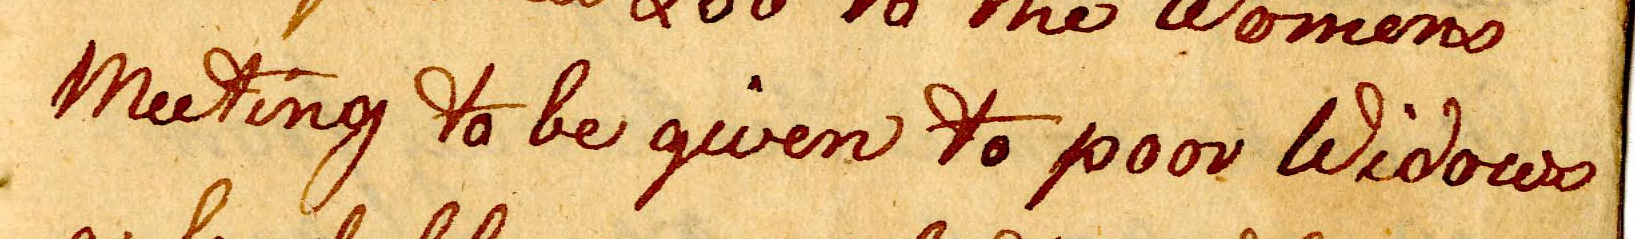Meeting to be given to poor Widows
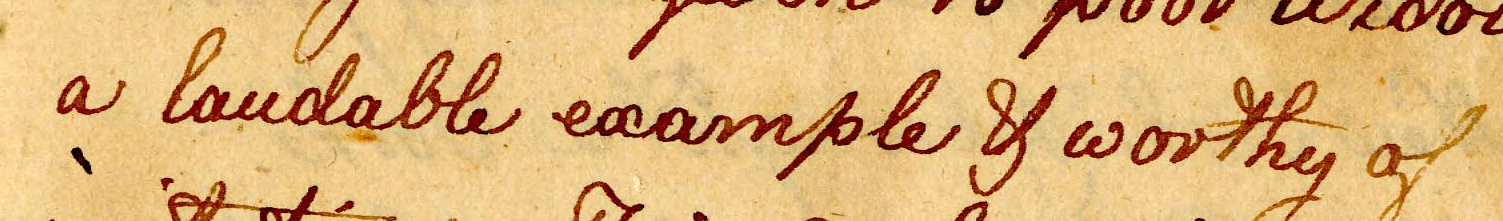a laudable example & worthy of
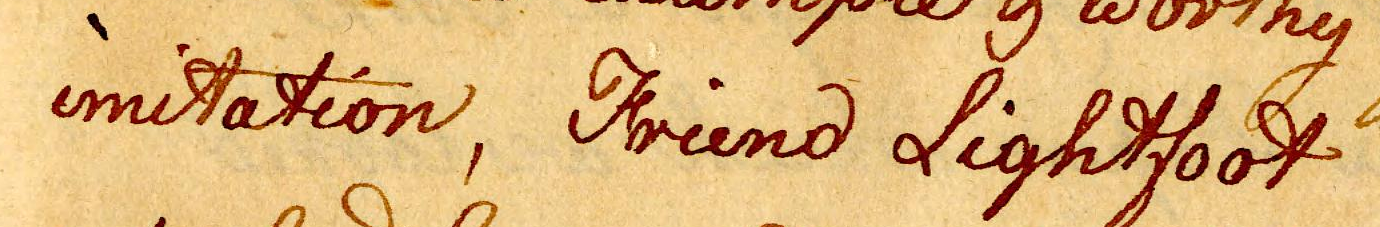imitation, Friend Lightfoot
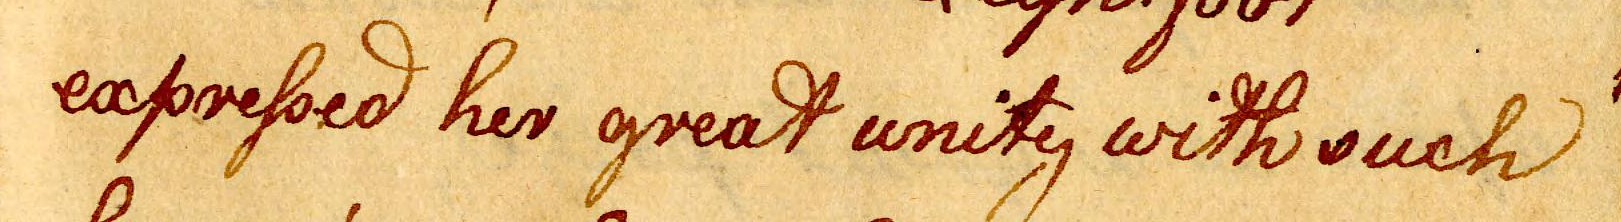expressed her great unity with such
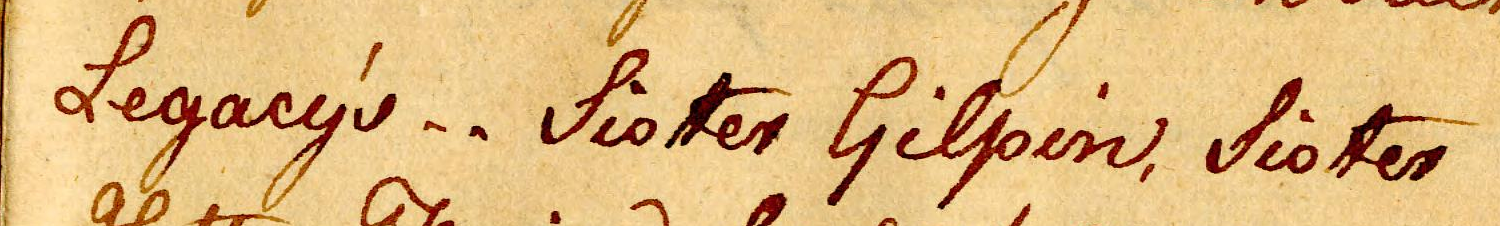Legacy's.. Sister Gilpin, Sister
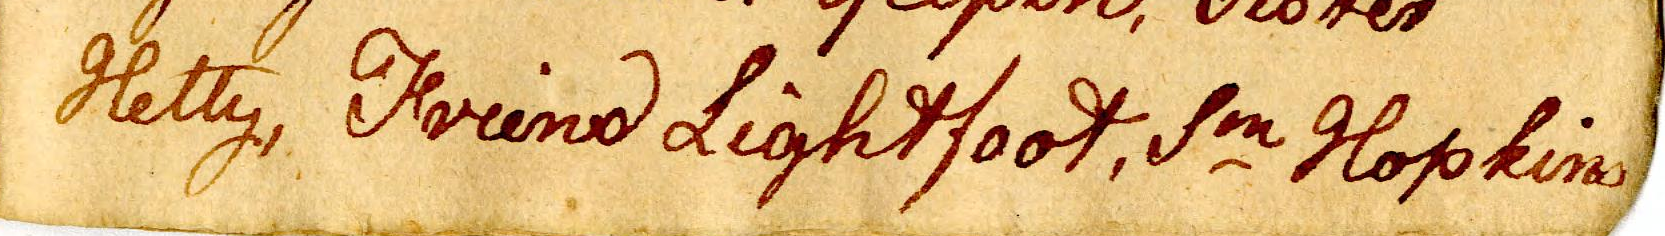Hetty, Friend Lightfoot, S^m Hopkins
